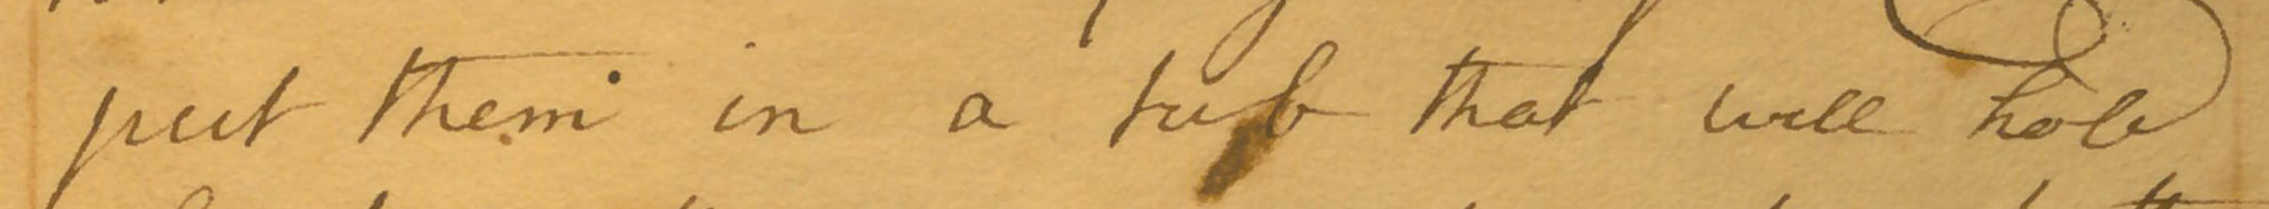put them in a tub that will hold
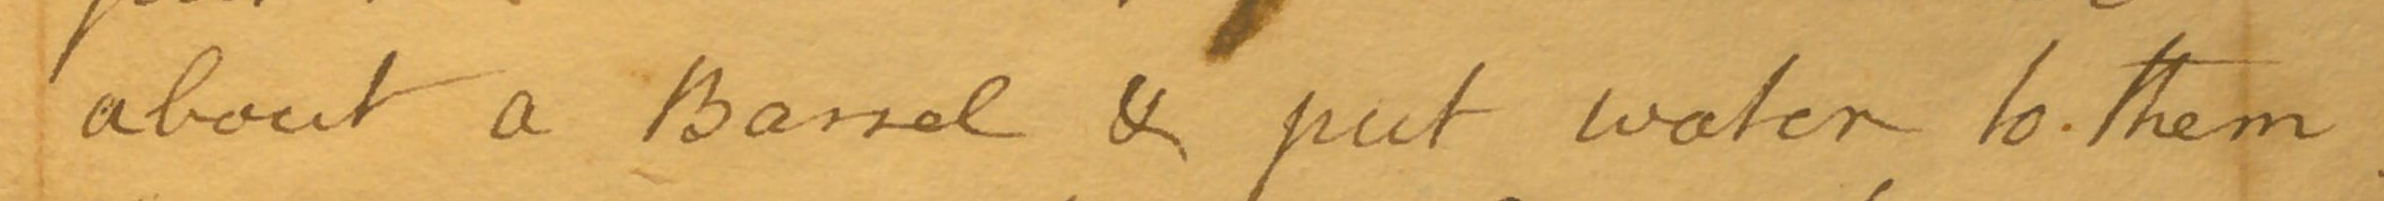about a Barrel & put water to them
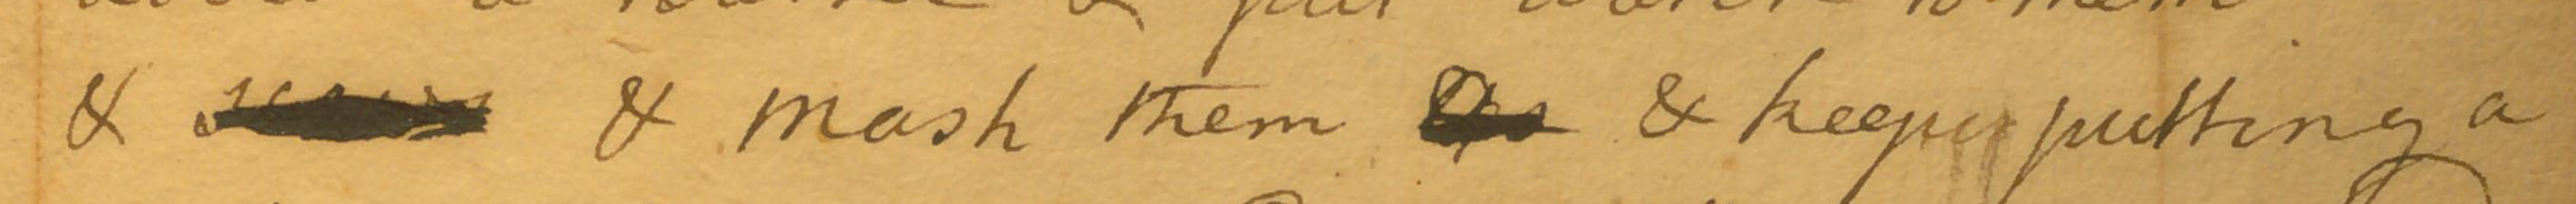& [_____] & mash them [___] & keep putting a
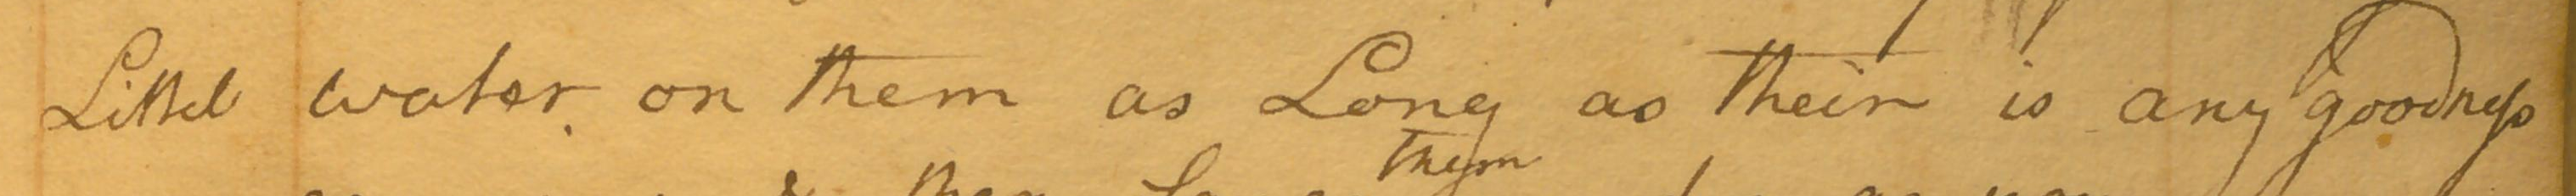Littel water on them as Long as their is any goodness
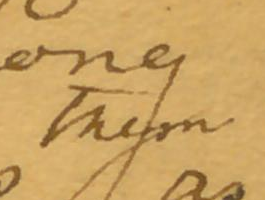them
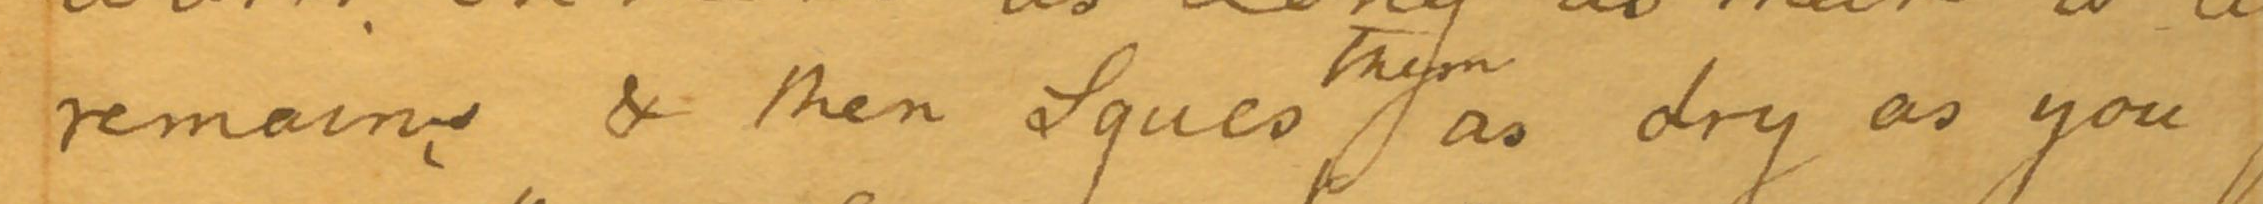remains, & then sques ^ as dry as you
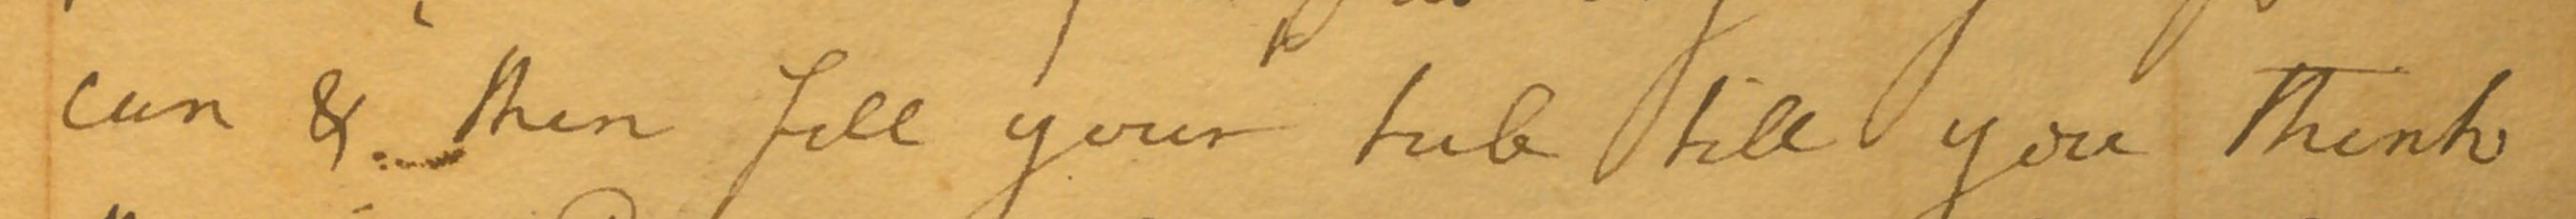can & then fill your tub till you think
